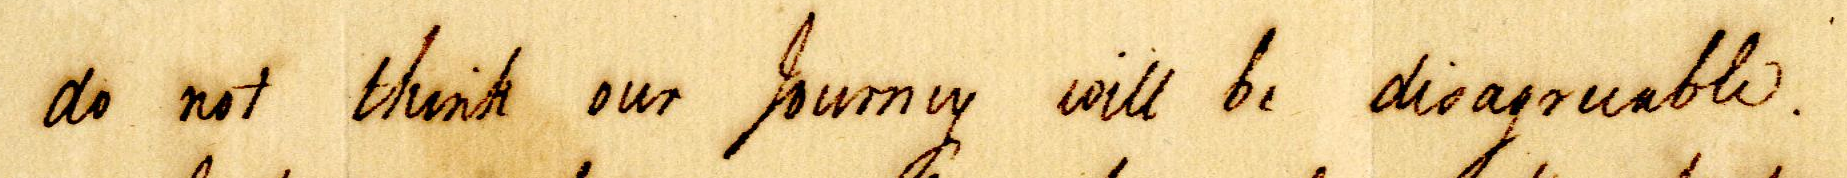do not think our Journey will be disagreeable.
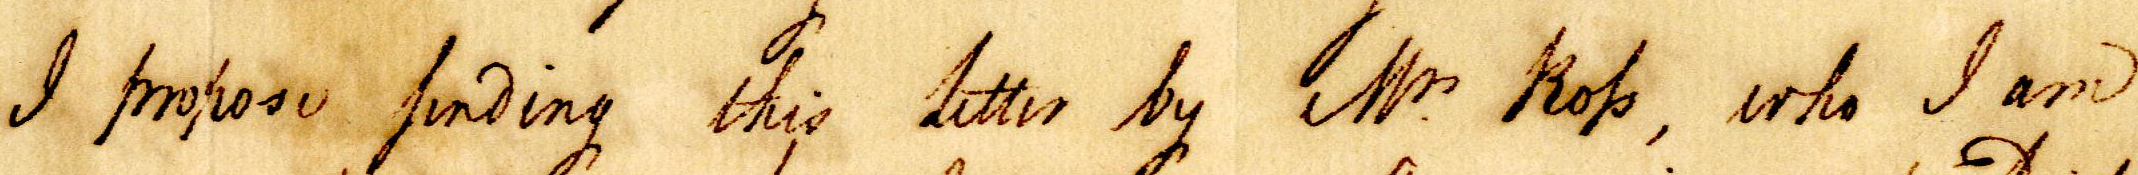I propose finding this Letter by M^rs. Ross, who I am
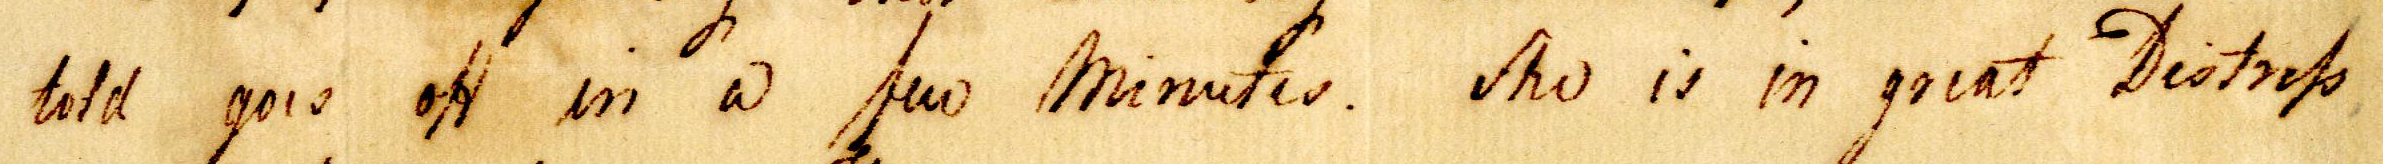told goes off in a few Minutes. She is in great Distress
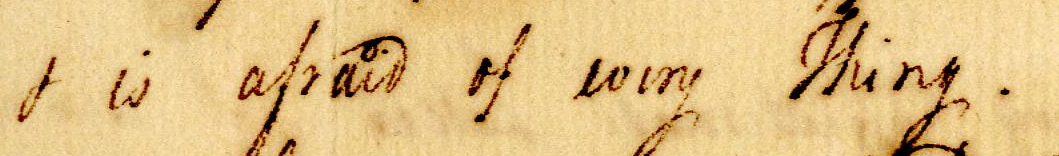& is afraid of every Thing.
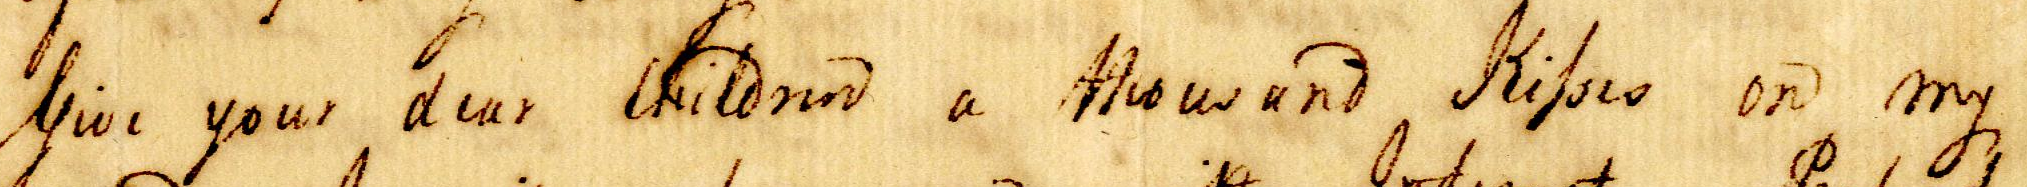Give your dear children a thousand Kisses on my
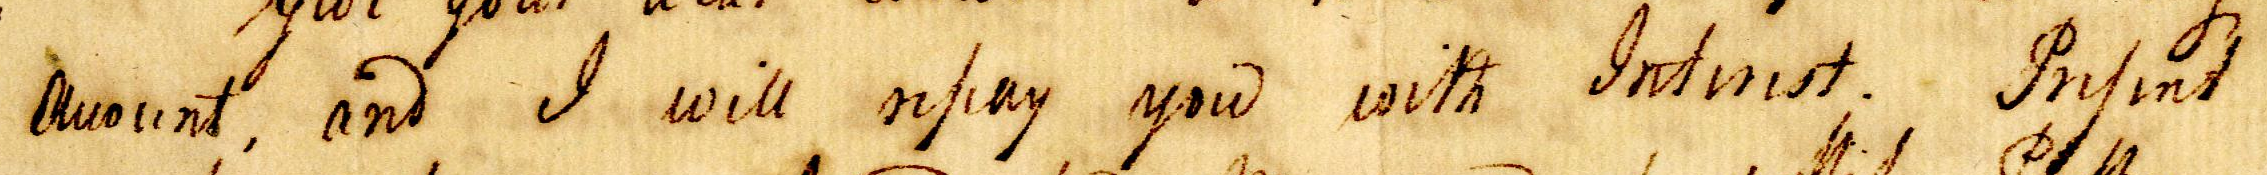Account, and I will repay you with Interest. Present
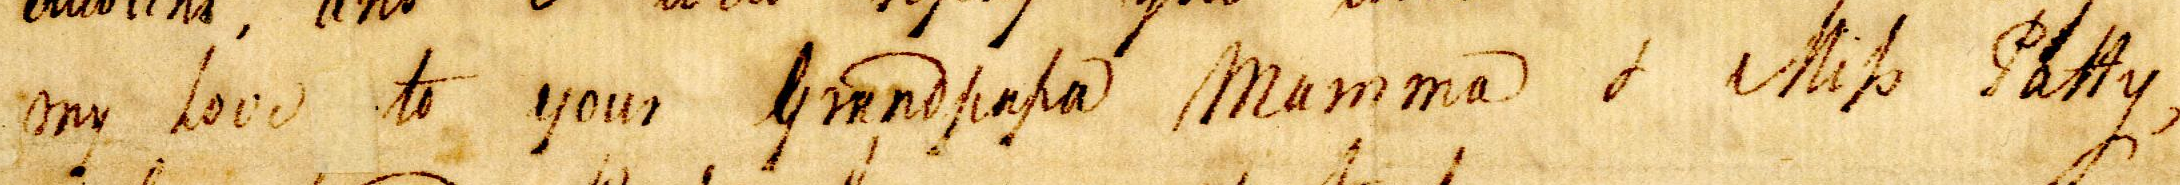my Love to your Grandpapa Mamma & Miss Patty,
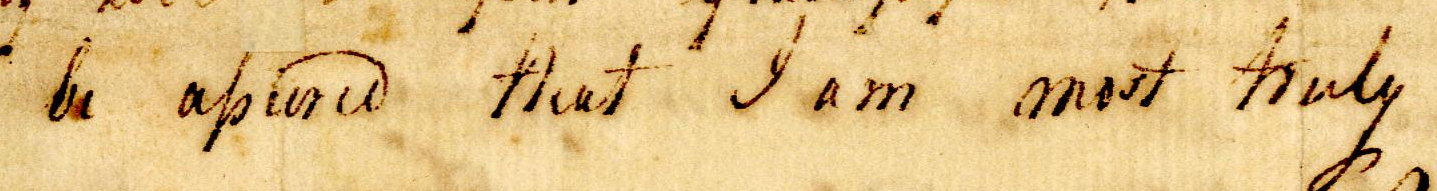be assured that I am most truly
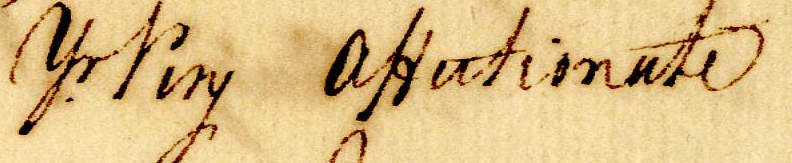Yr. Very affectionate
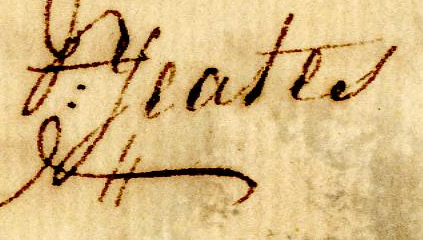J: Yeates
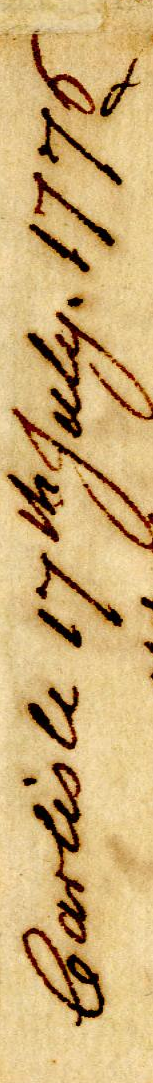Carlisle 17^th July. 1776
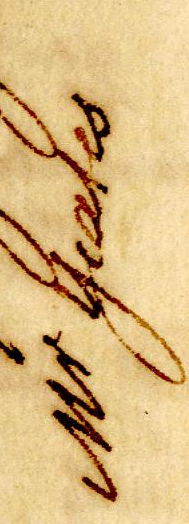M^r Yeates
